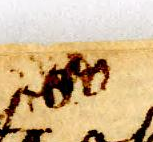50
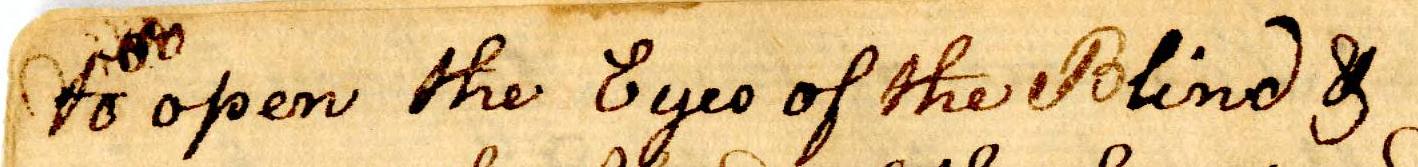to open the Eyes of the Blind &
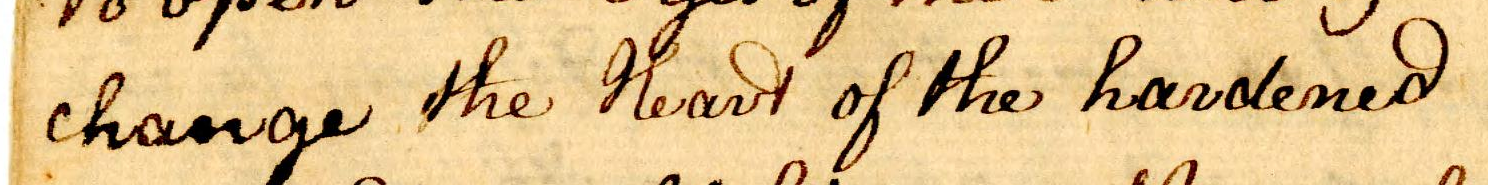change the Heart of the hardened
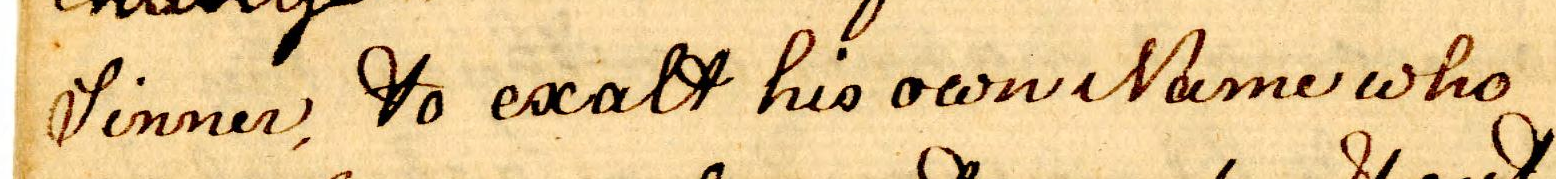Sinner, to exalt his own Name who
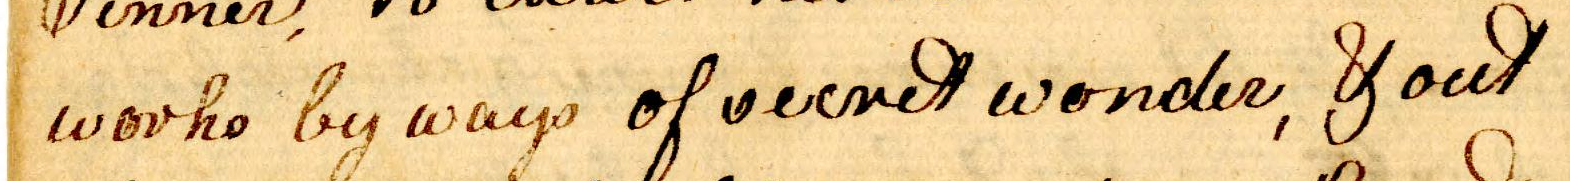works by ways of secret wonder, & out
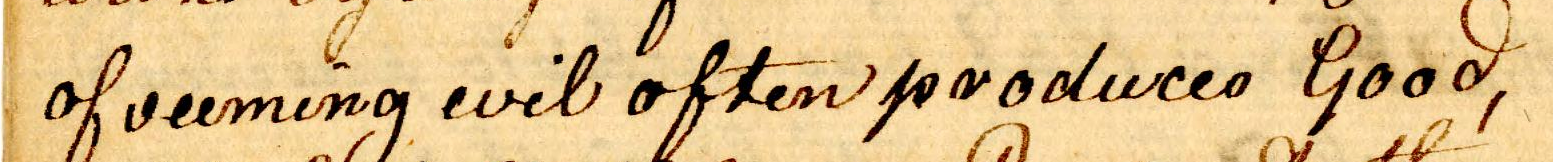of seeming evil often produces Good,
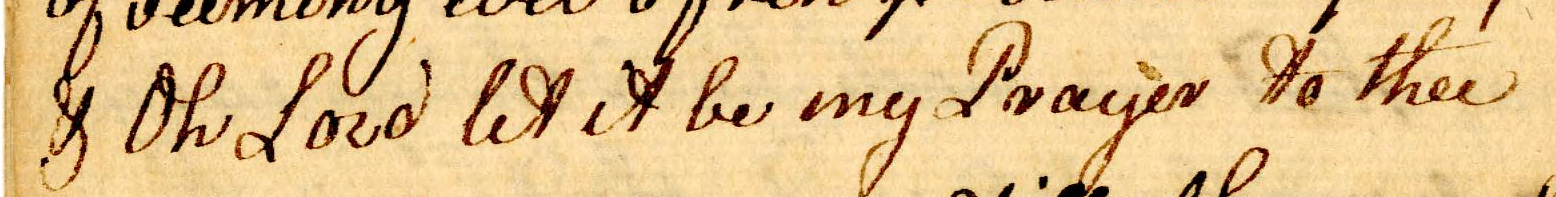& Oh Lord let it be my Prayer to thee
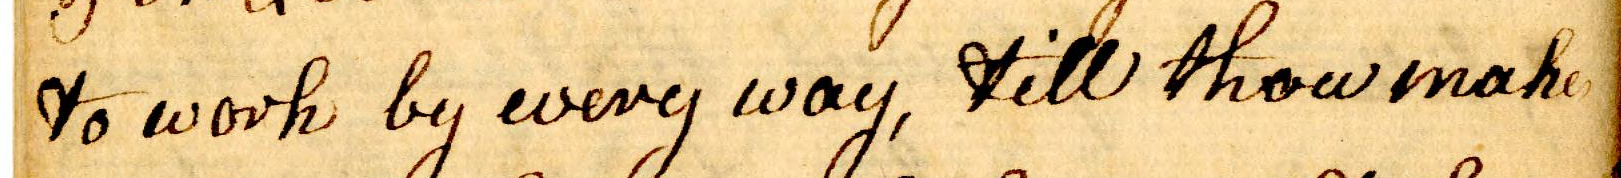to work by every way, till thou make
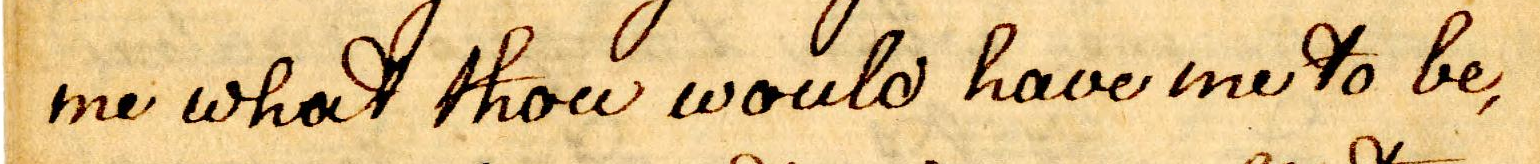me what thou would have me to be,
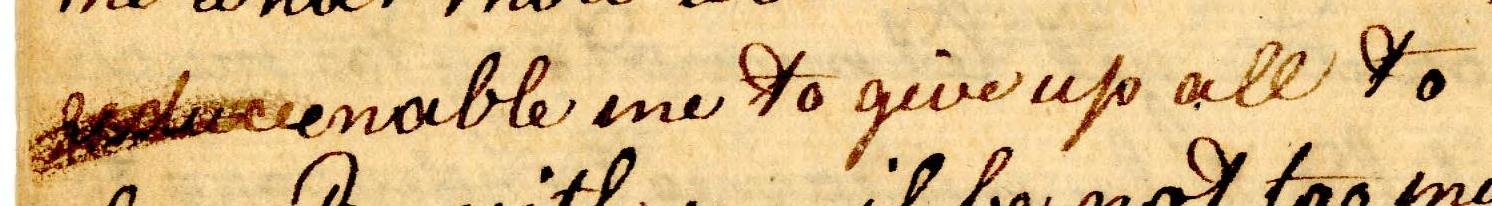[reduce] enable me to give up all to
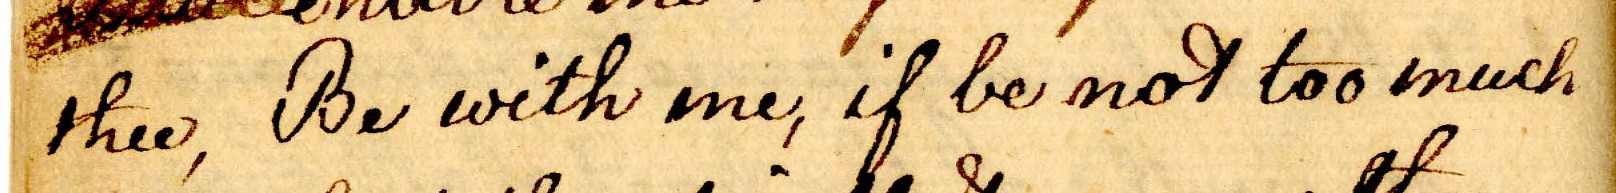thee, Be with me, if be not too much
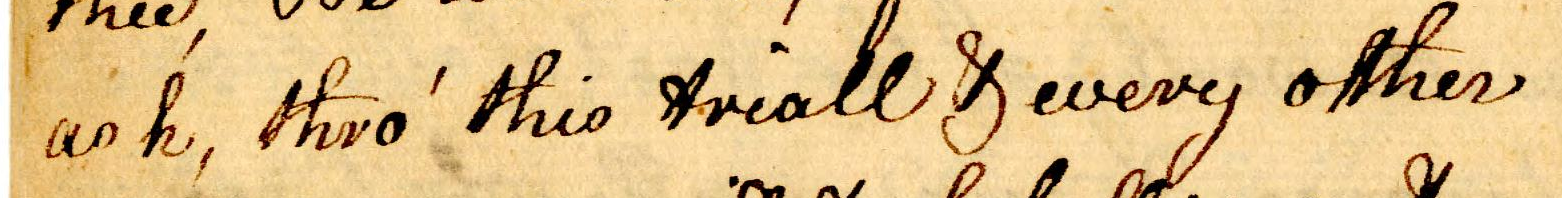ask, thro' this triall & every other
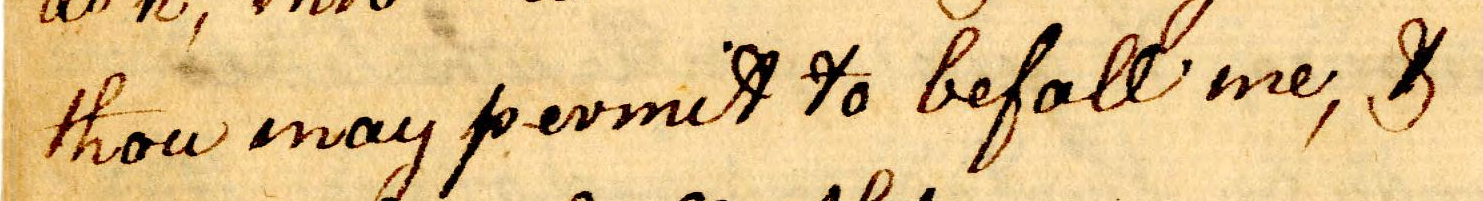thou may permit to befall me, &
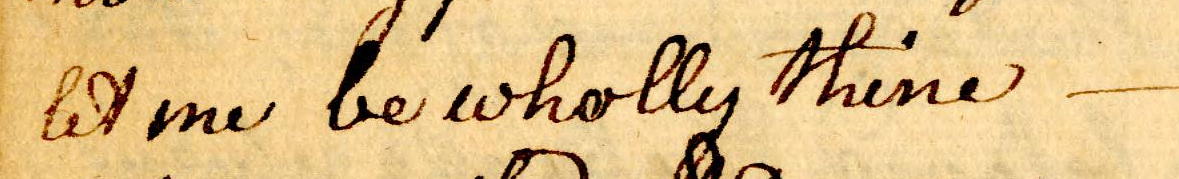let me be wholly thine-
